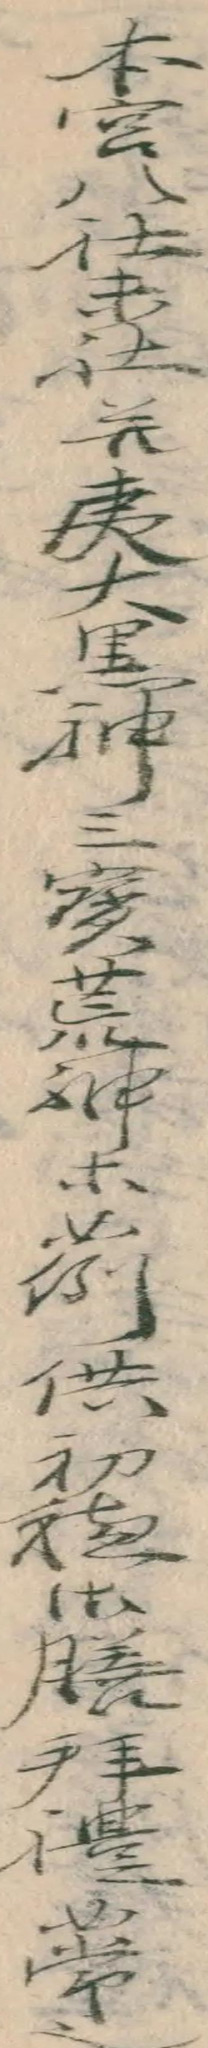本宮八社未社并夷大黒神三寶荒神等如例供初穂御膳拝禮如常也
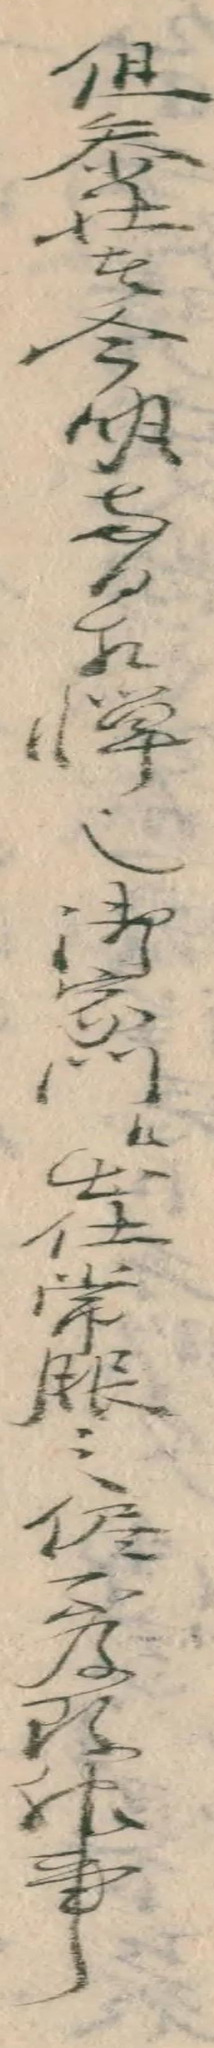但参社は今明両日相憚也御家門え出仕常服之侭不及改服事
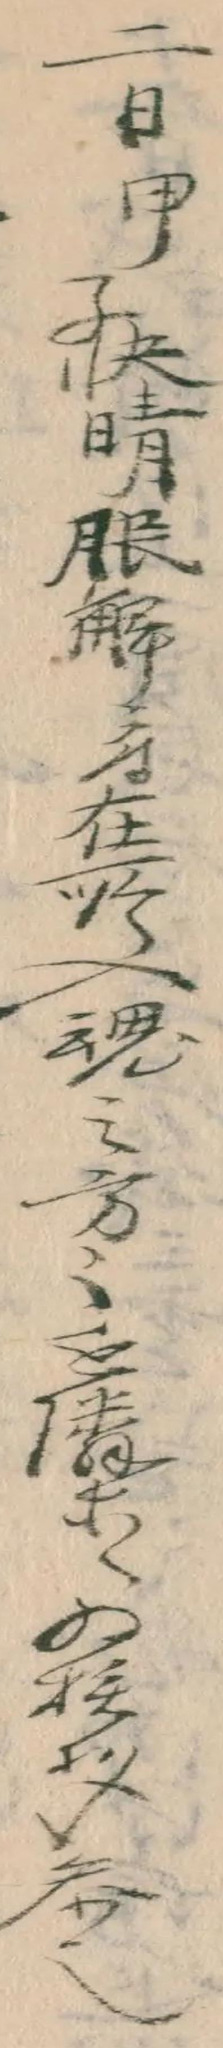二日甲乙快晴服解ニ付在所入魂之方々平隣等へ為挨拶参也
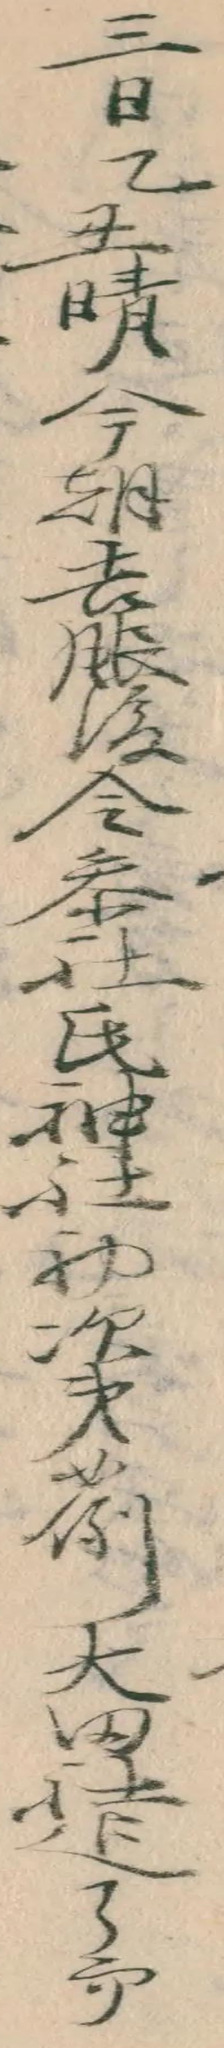三日乙丑晴今朝去服後令参社氏神社勤次第如例大田社迄了而
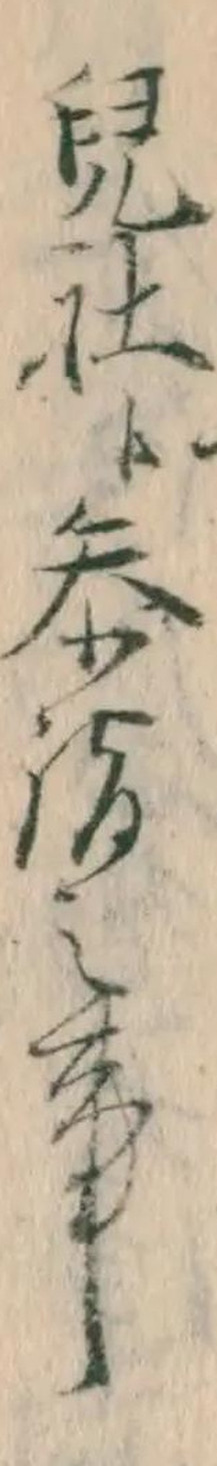兒社え参詣之事
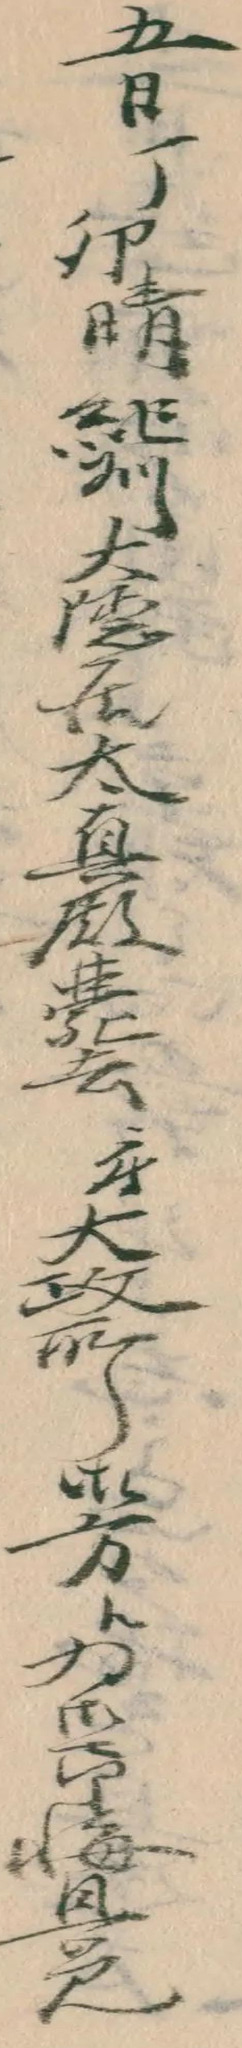五日丁卯晴紀州大隠居太真殿薨去ニ付大政所之御方え為御弔悔具覚
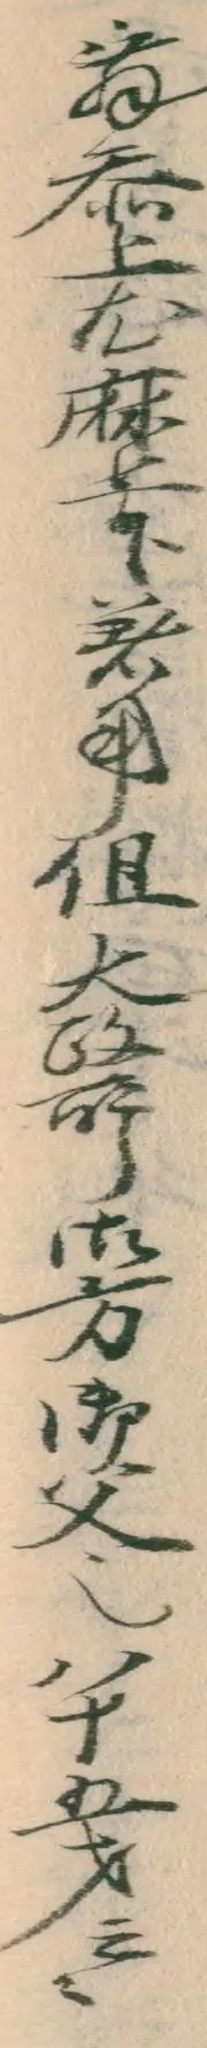舞参上尤麻上下着用但大政所御方御父也八十五才云々
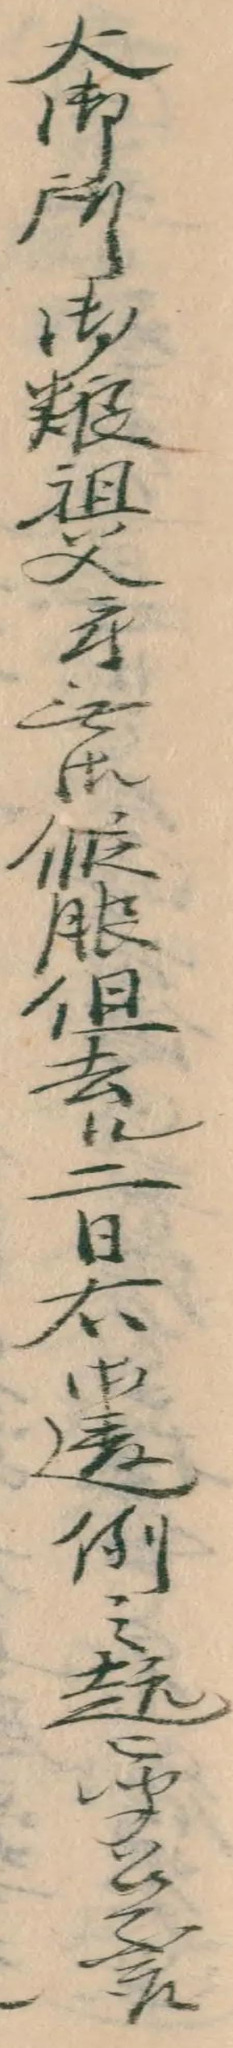大御所御艱祖父ニ付無御假服但去ル二日右御違例之趣被聞召不取
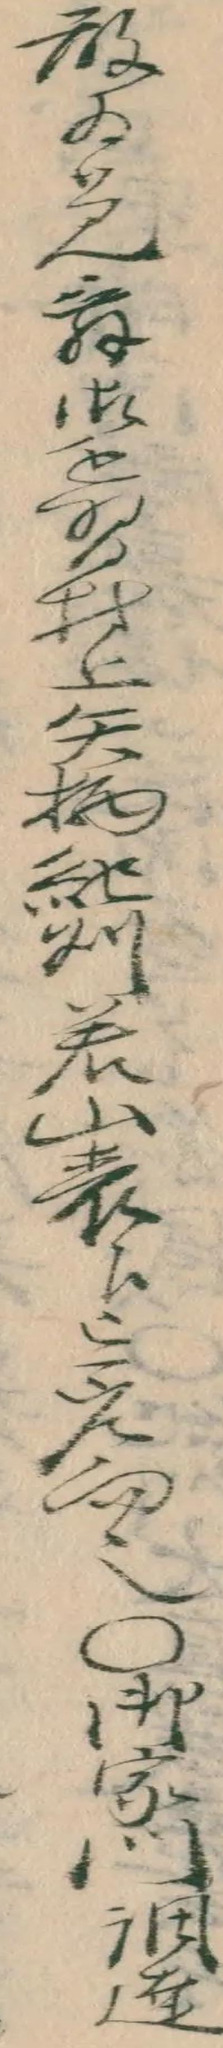殿為御見舞御近習村上矢柄紀州若山表江被差向也○御家門調達
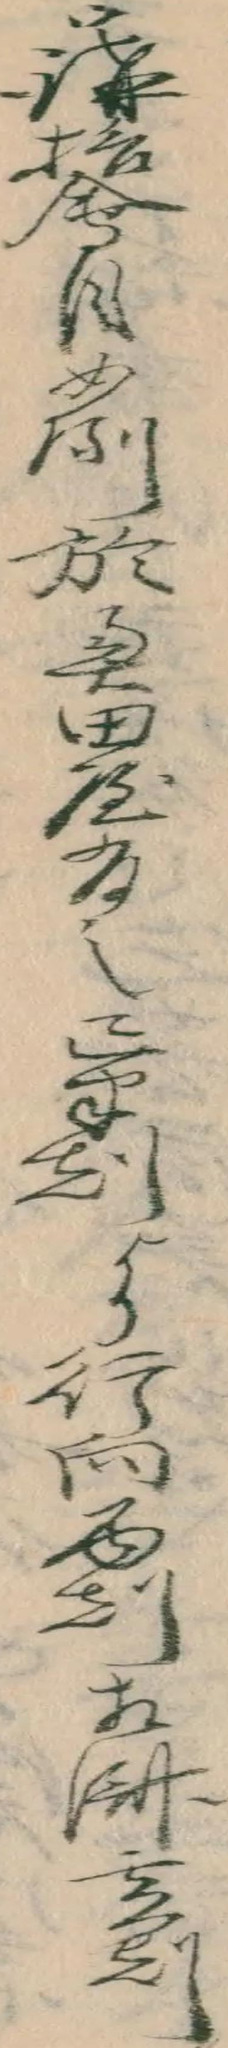御講拾會目如例於奥田屋有之巳半刻より行向酉刻相済亥刻
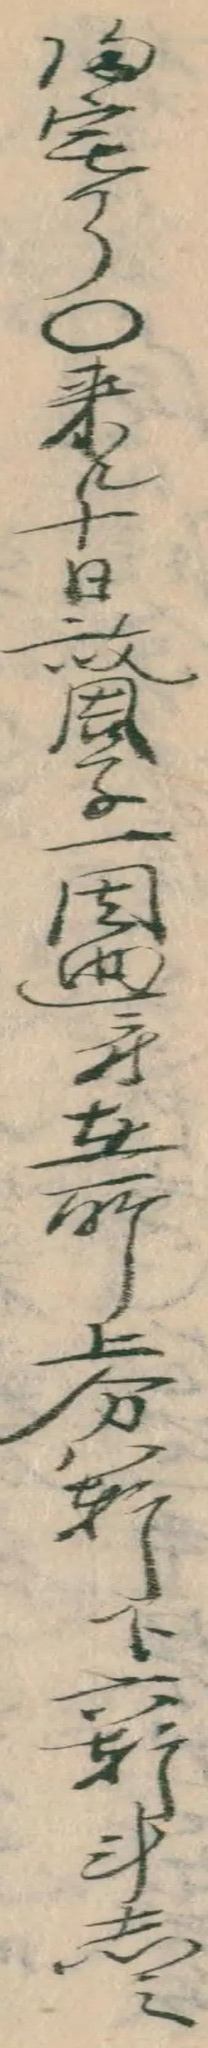帰宅了〇来ル十日故周子一周廻ニ付在所上分は軒下六軒斗志之
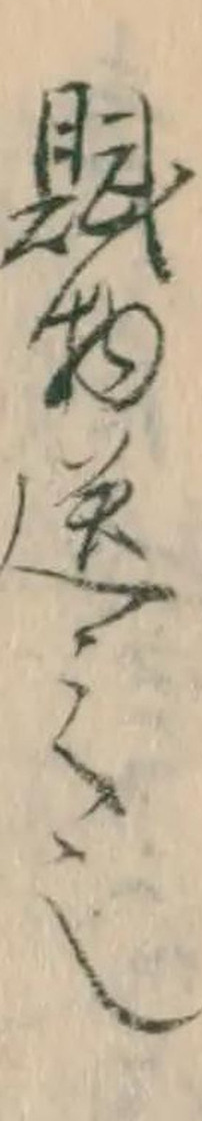賦物送之也
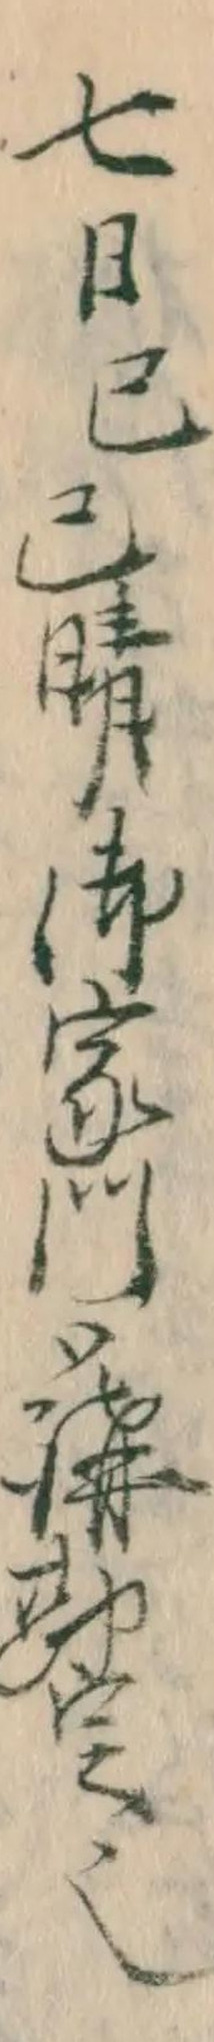七日己巳晴御家門御講勧定也
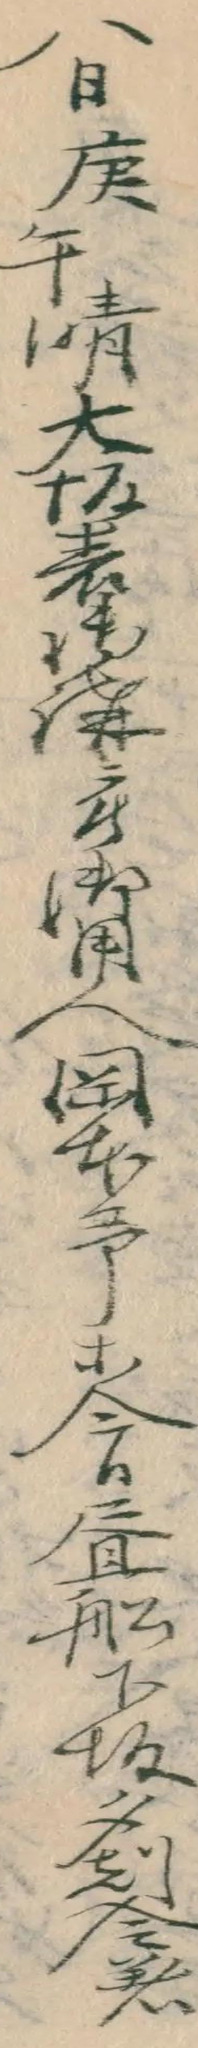八日庚午晴大坂表御講ニ付御用人岡本予等今日昼舩下坂夕刻令着
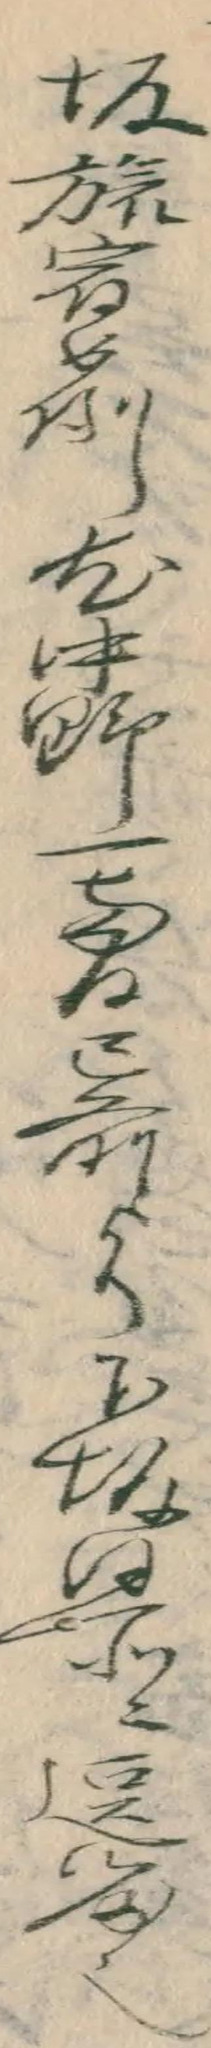坂旅宿如例尤中野一両日已前より下坂同所ニ逗留也
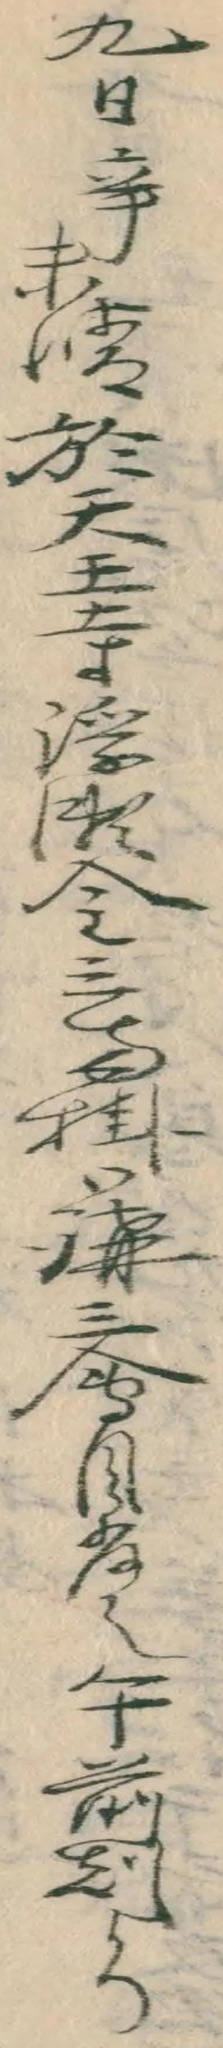九日辛寅晴於天王寺浮瀬金三両掛御講三會自有之午前刻より
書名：賀茂社記録. 第65冊
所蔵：国立国会図書館 National Diet Library, JAPAN
